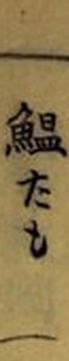鰛たも

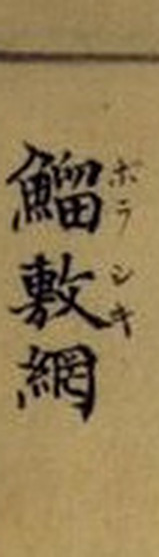鰡敷網

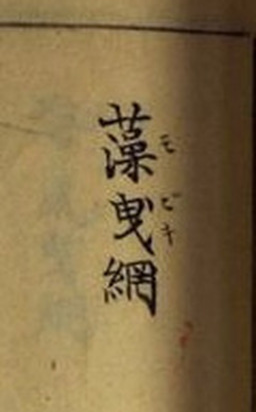藻曳網

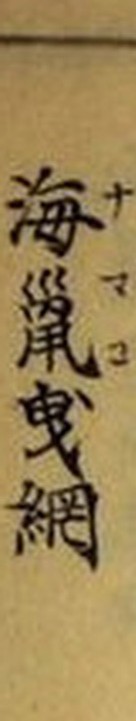海鼠曳網

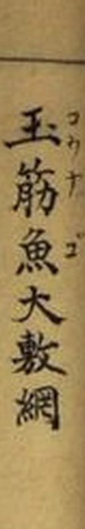玉筋魚大敷網

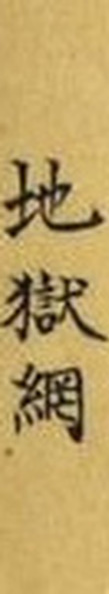地獄網

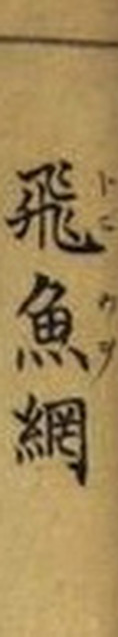飛魚網

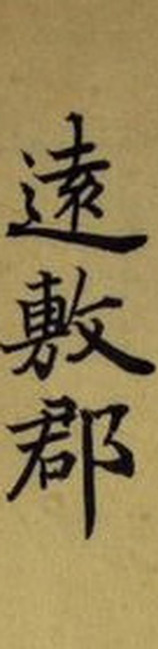遠敷郡
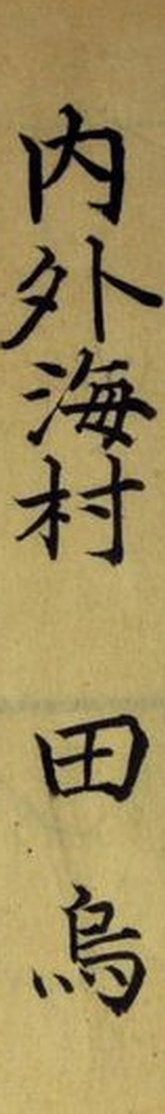内外海村田烏

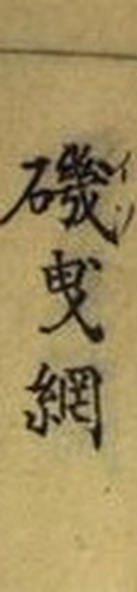磯曳網

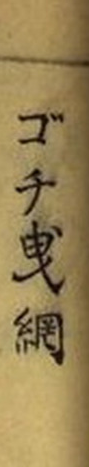ゴチ曳網

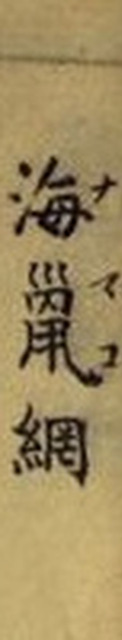海鼠網

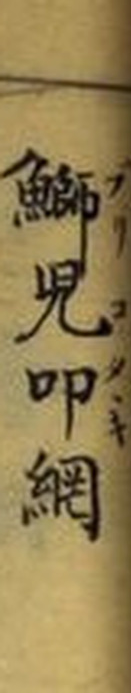鰤児叩網

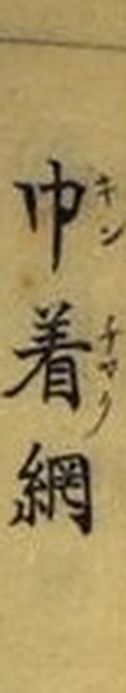巾着網

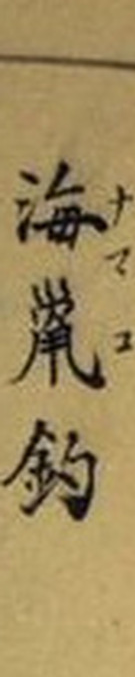海鼠釣

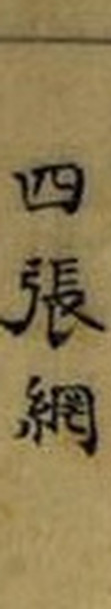四張網
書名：漁具図 若狭海ノ部[画像あり]
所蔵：福井県文書館 Fukui Prefectural Archives
